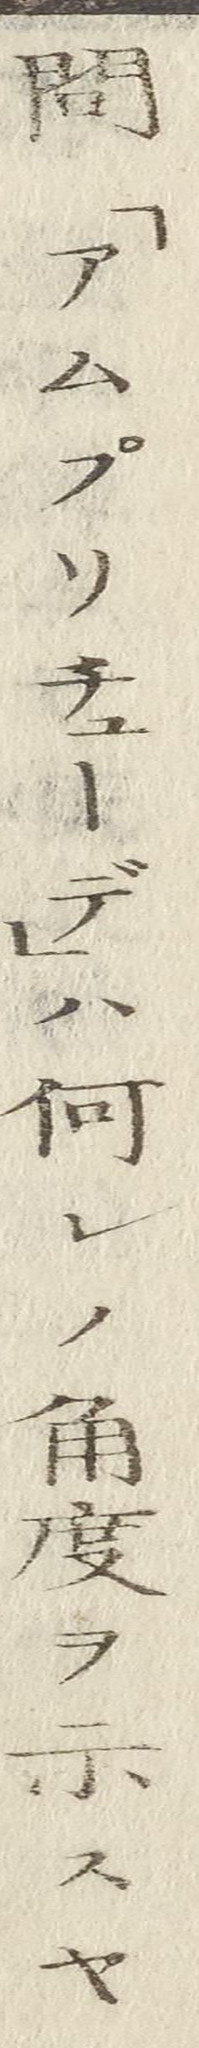問「アムプリチューデ」ハ何レノ角度ヲ示スヤ
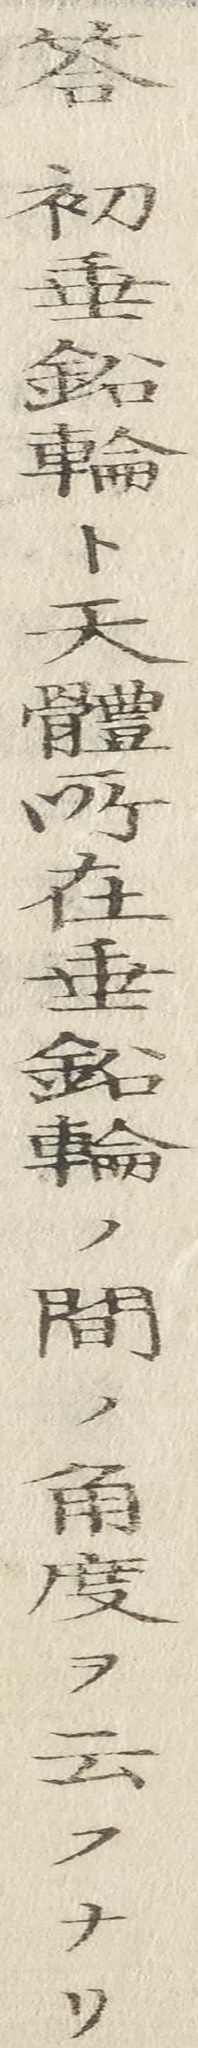答初垂鉛輪ト天体所在垂鉛輪ノ間ノ角度ヲ云フナリ
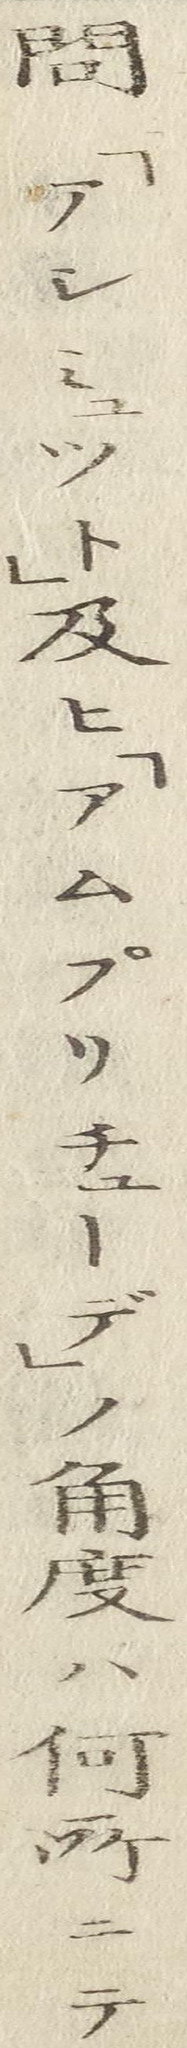問「アシミュツト」及ヒ「アムプリチューデ」ノ角度ハ何所ニテ
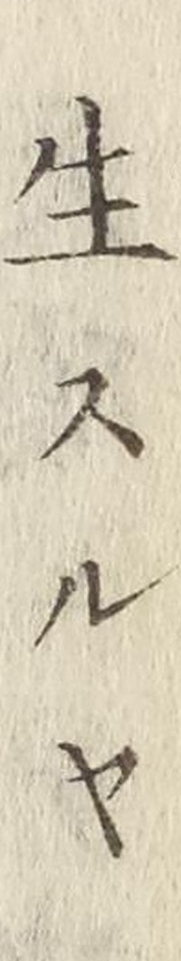生スルヤ

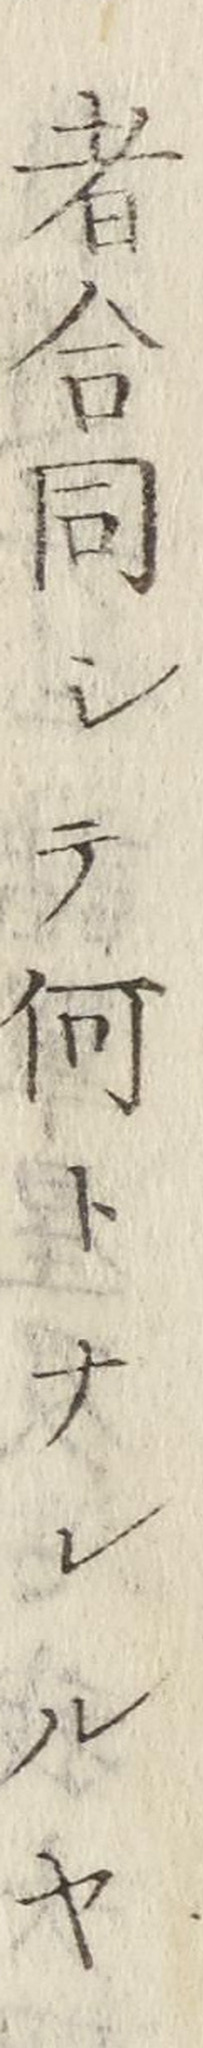者合同シテ何トナレルヤ
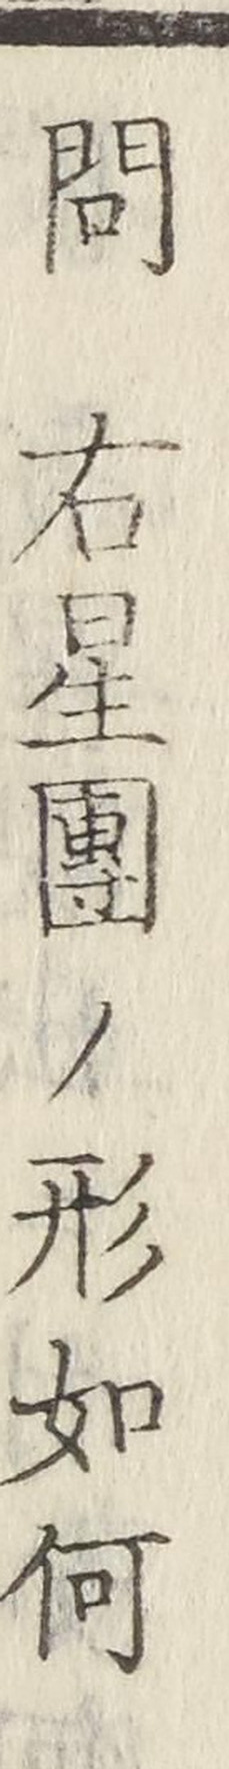問右星団ノ形如何
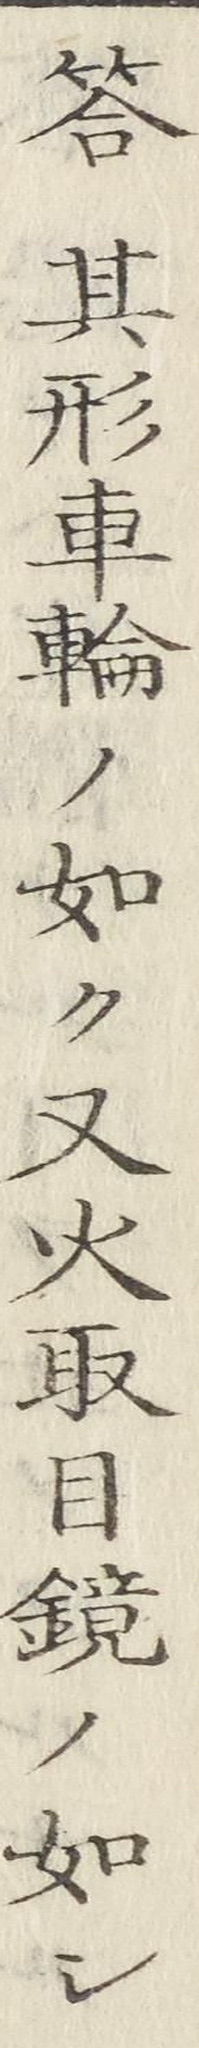答其形車輪ノ如ク又火取目鏡ノ如シ
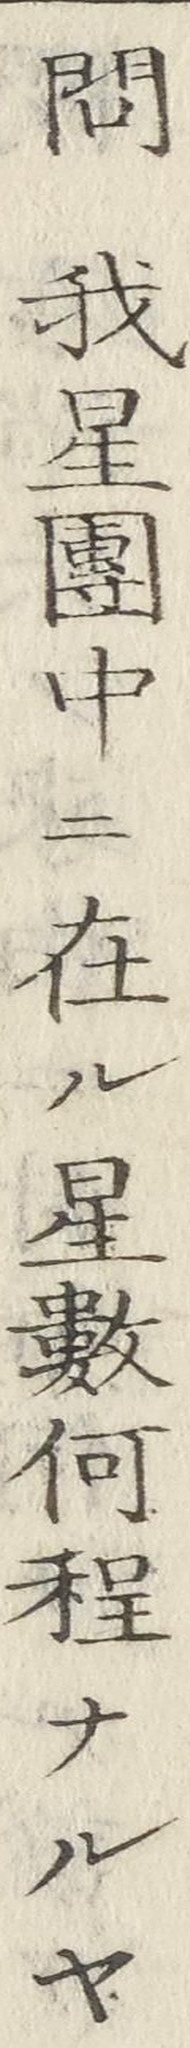問我星団中ニ在ル星数何程ナルヤ
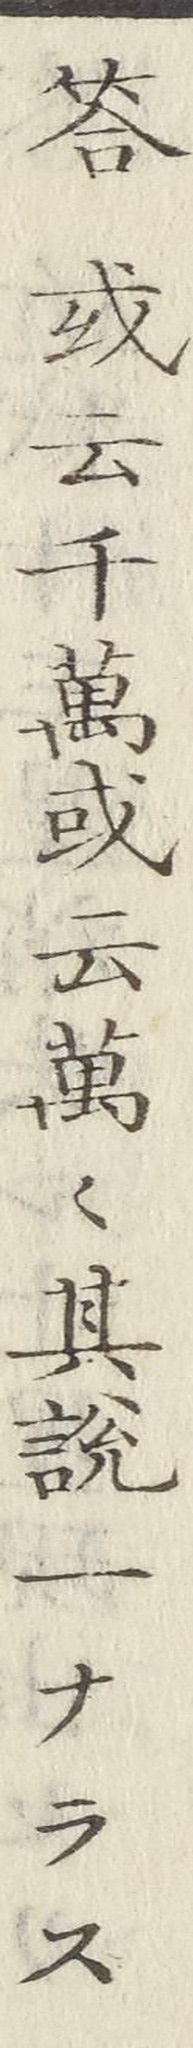答或云千万或云万々其説一ナラス
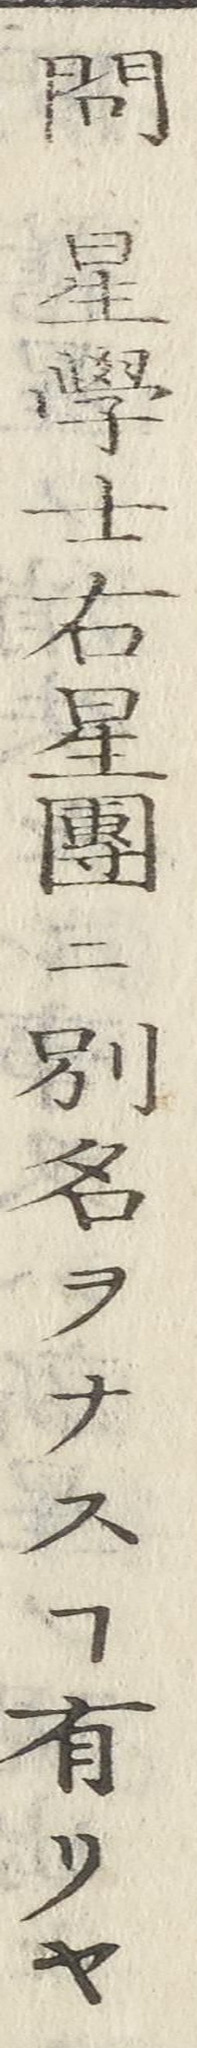問星学士右星団ニ別名ヲナスコト有リヤ
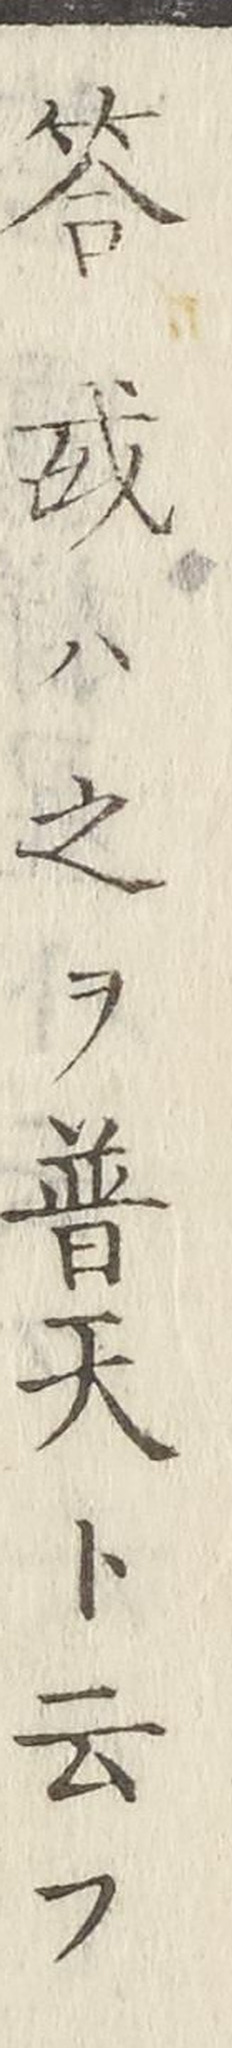答或ハ之ヲ普天ト云フ
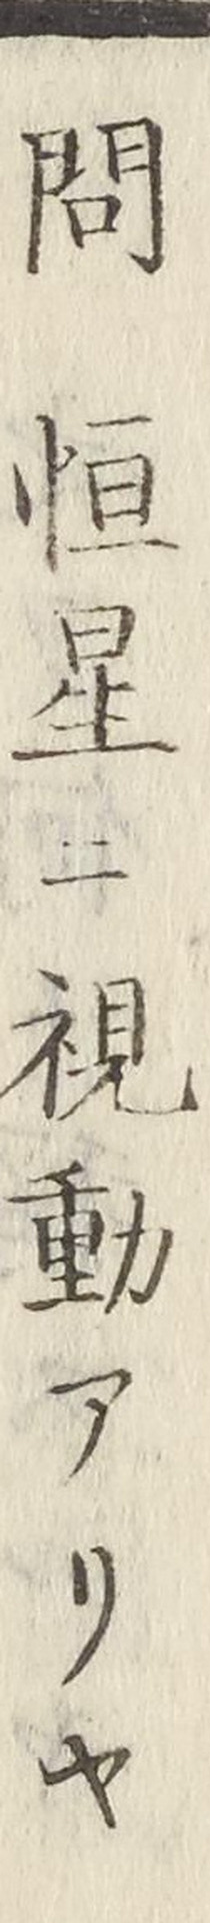問恒星ニ視動アリヤ
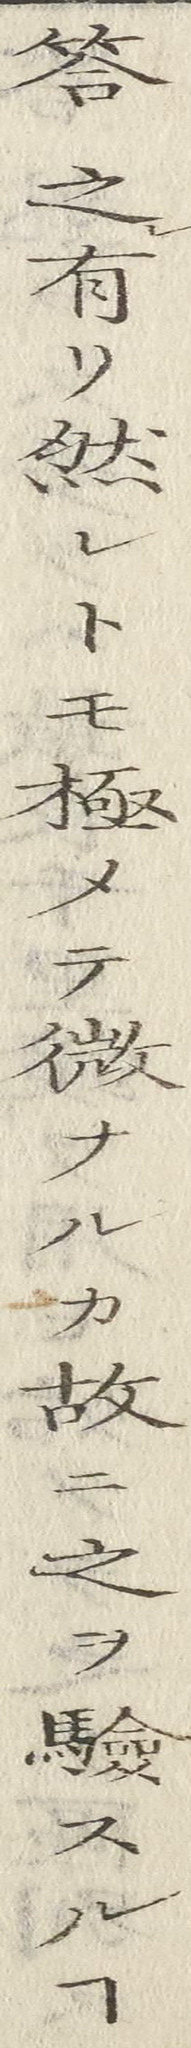答之レ有リ然レトモ極メテ微ナルカ故ニ之ヲ験スルコト
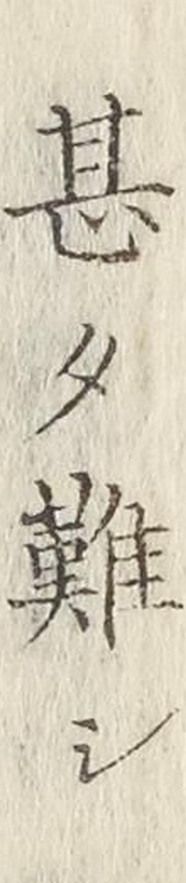甚タ難シ
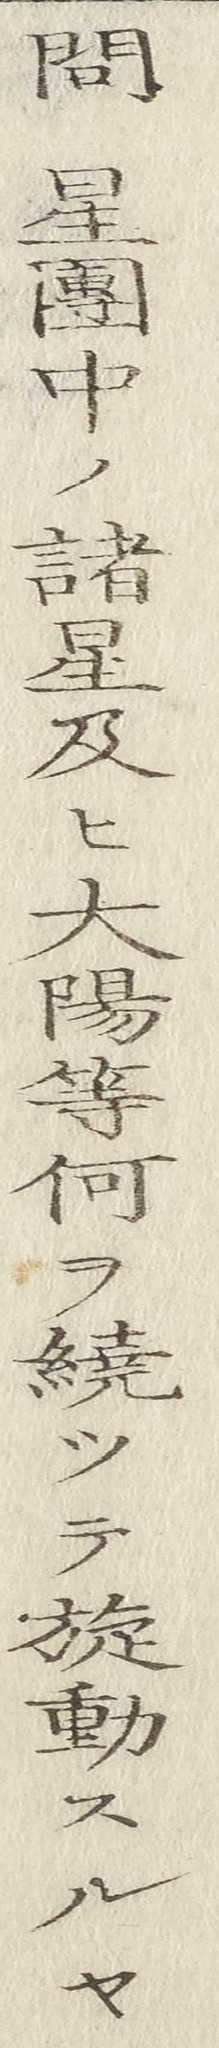問星団中ノ諸星及ヒ大陽等何ヲ繞ツテ旋動スルヤ
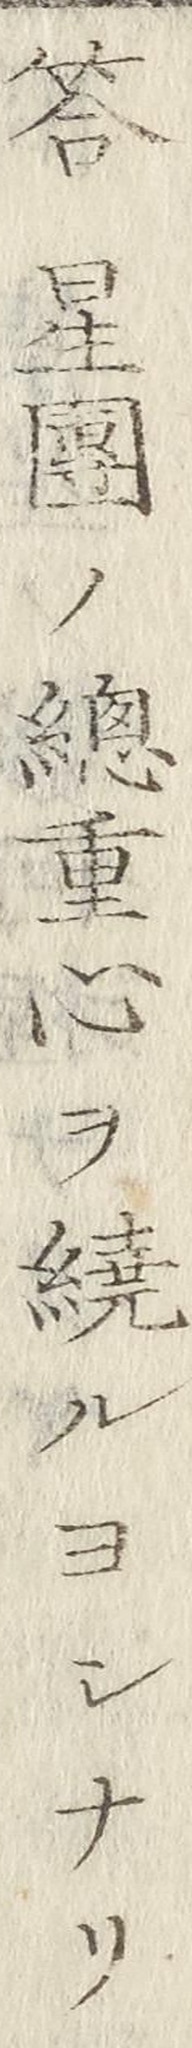答星団ノ総重心ヲ繞ルヨシナリ
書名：星学圖説　下
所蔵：東京大学地震研究所図書室 Earthquake Research Institute Library, The University of Tokyo, JAPAN
